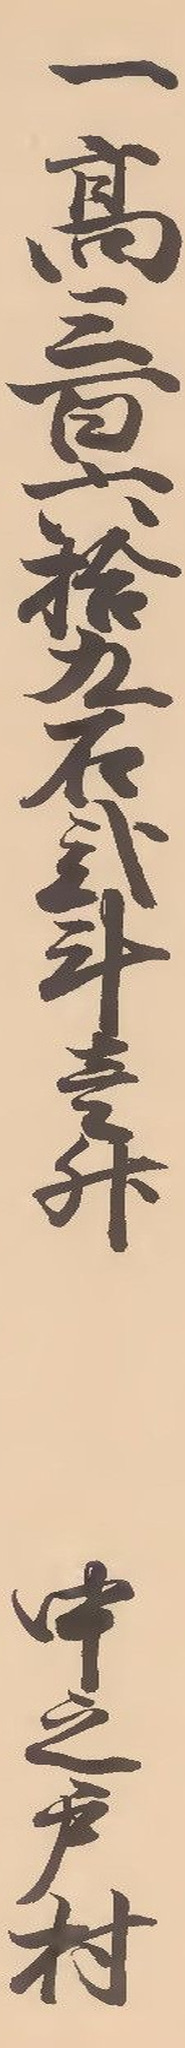一高三百六拾九石弐斗壱升中之戸村
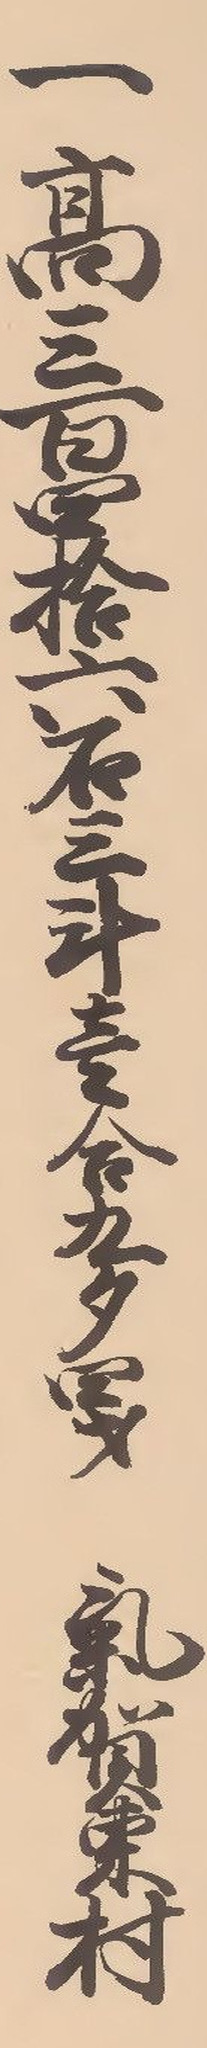一高三百四拾六石三斗壱合九勺四才気賀東村
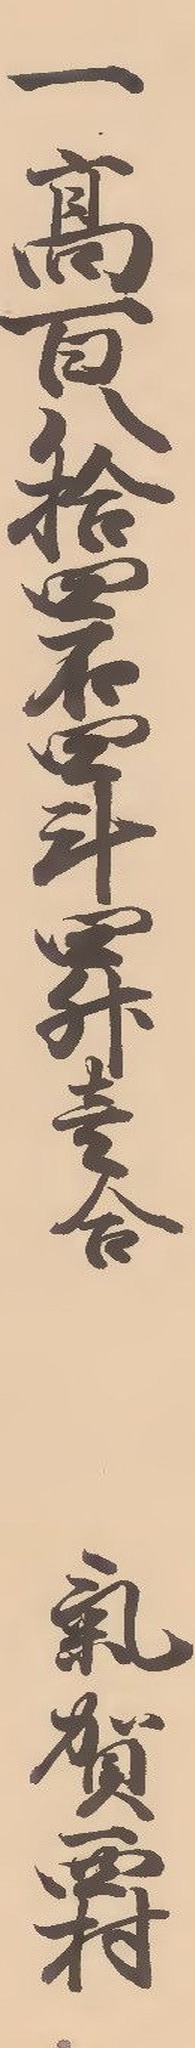一高百八拾四石四斗四升壱合気賀西村
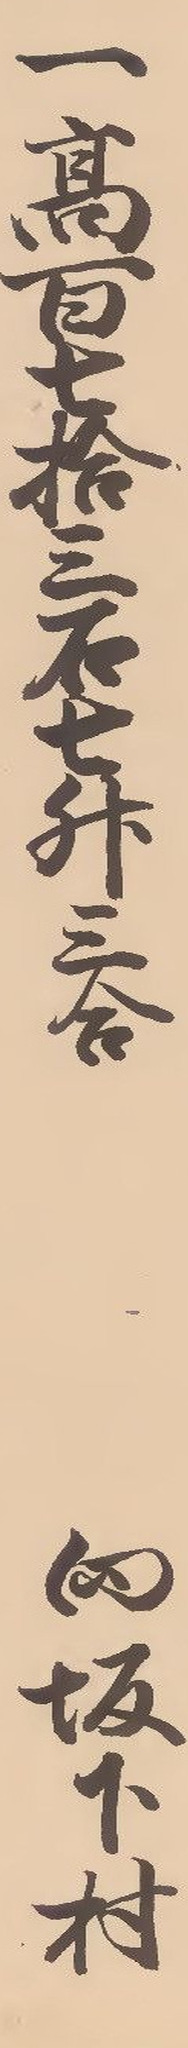一高百七拾三石七升三合向坂下村
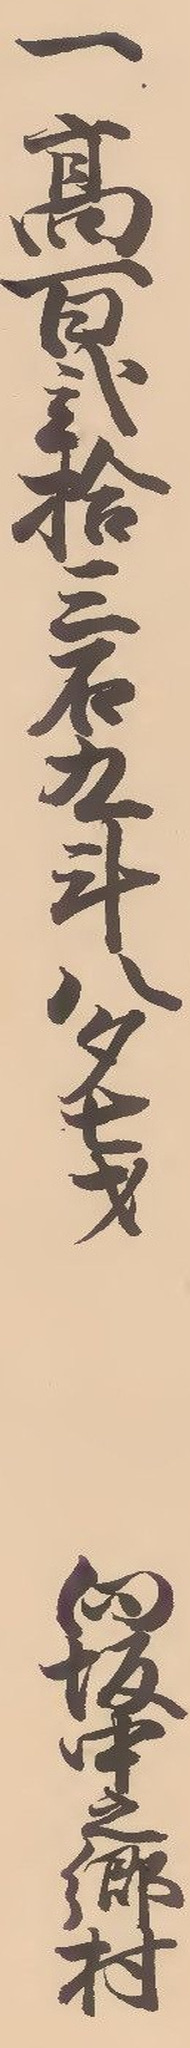一高百弐拾三石九斗八勺七才向坂中之郷村

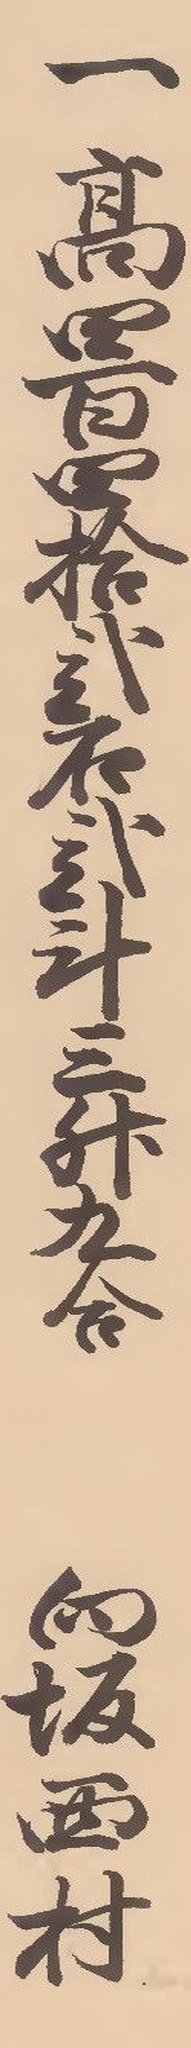一高四百四拾弐石弐斗三升九合向坂西村
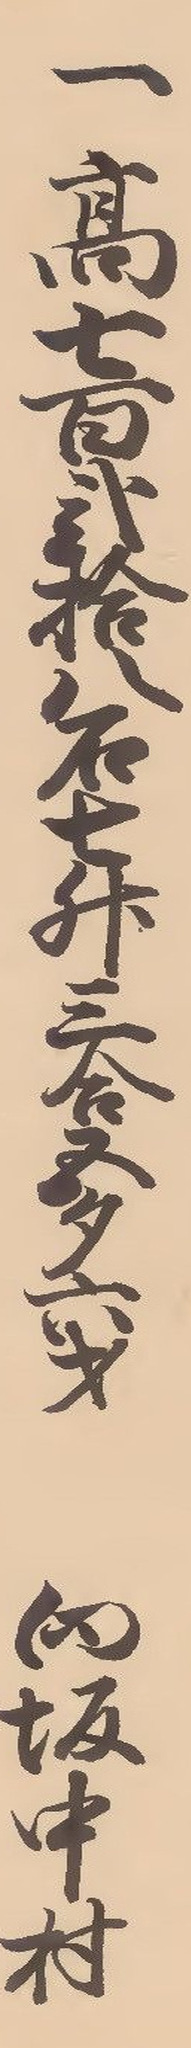一高七百弐拾八石七升三合五勺六才向坂中村
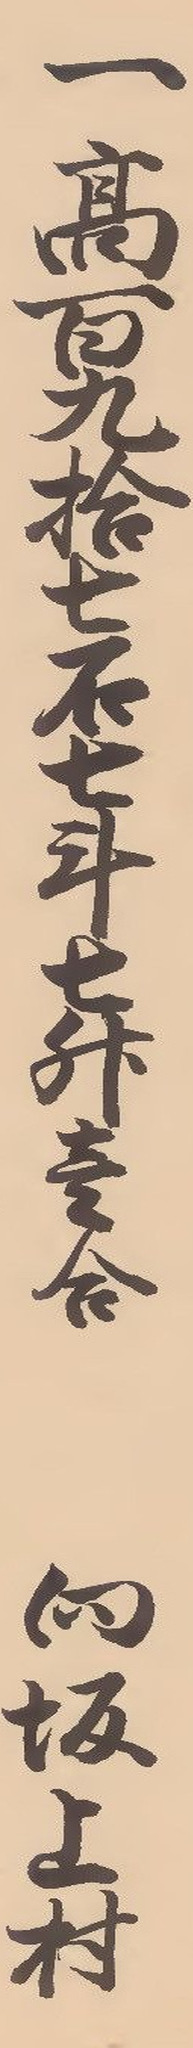一高百九拾七石七斗七升壱合向坂上村
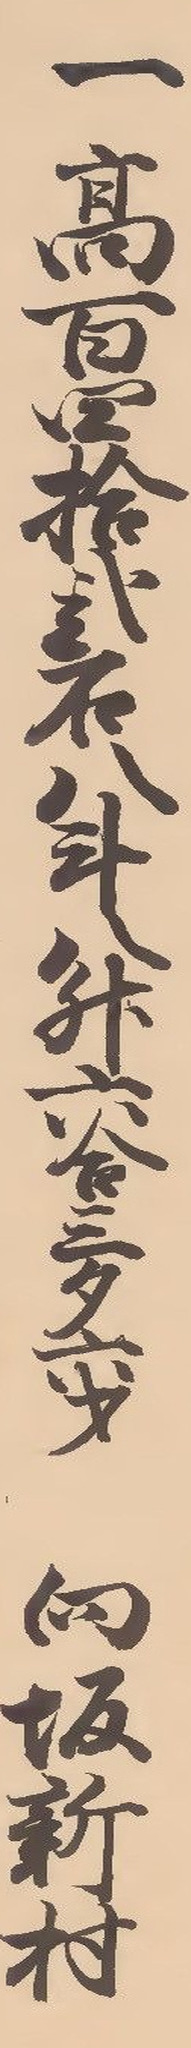一高百四拾弐石八斗八升六合三勺六才向坂新村
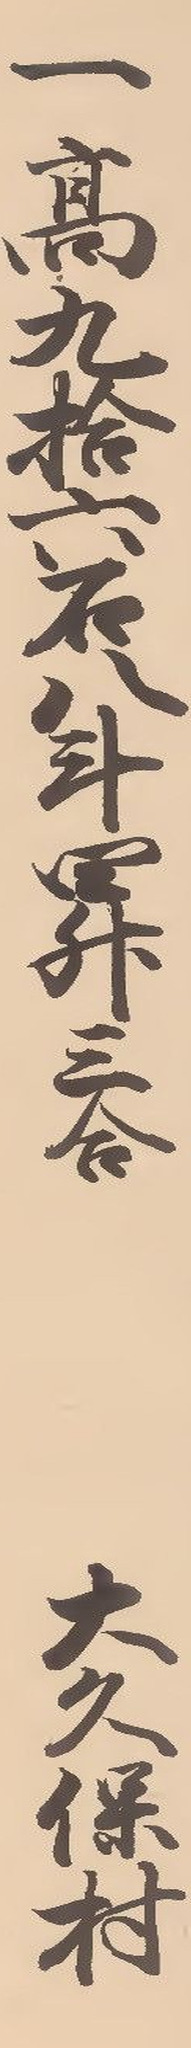一高九拾六石八斗四升三合大久保村
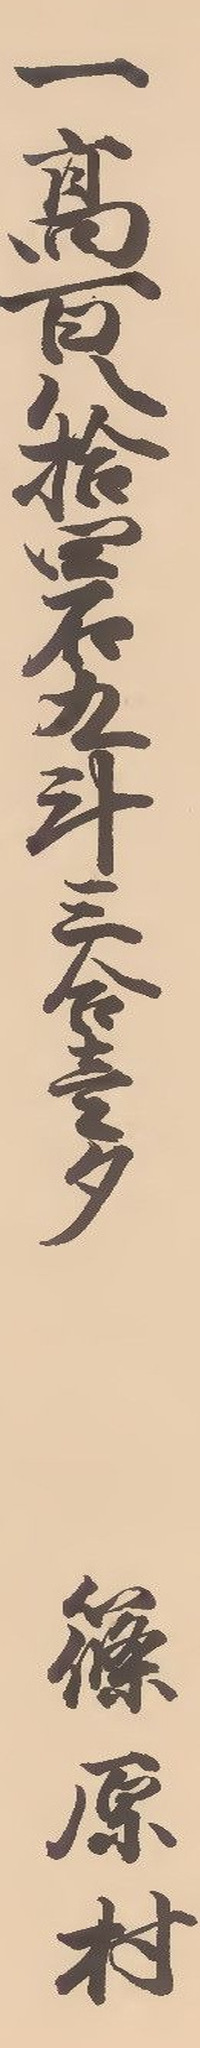一高百八拾四石九斗三合壱勺篠原村
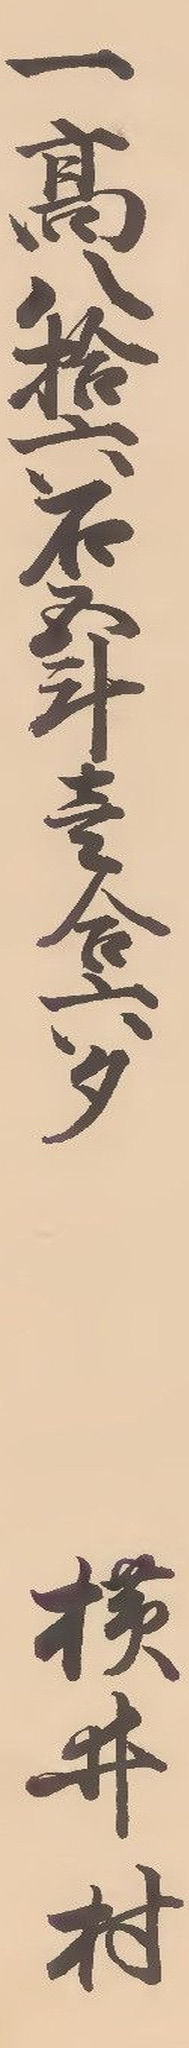一高八拾六石五斗壱合六勺横井村

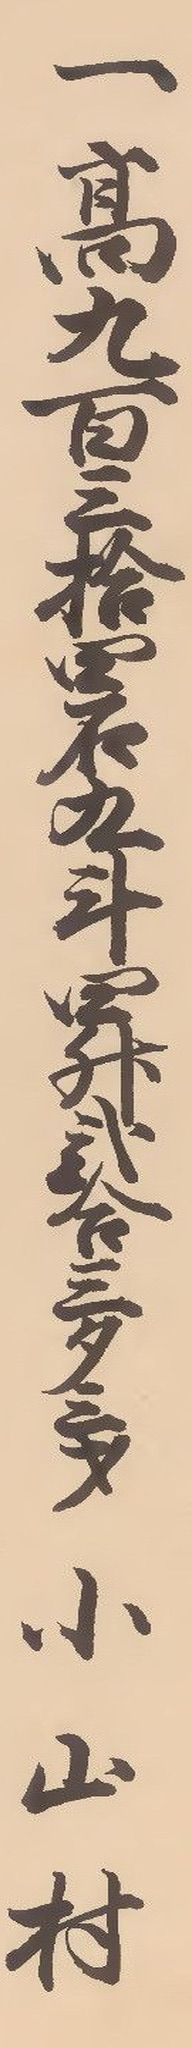一高九百三拾四石九斗四升弐合三勺三才小山村
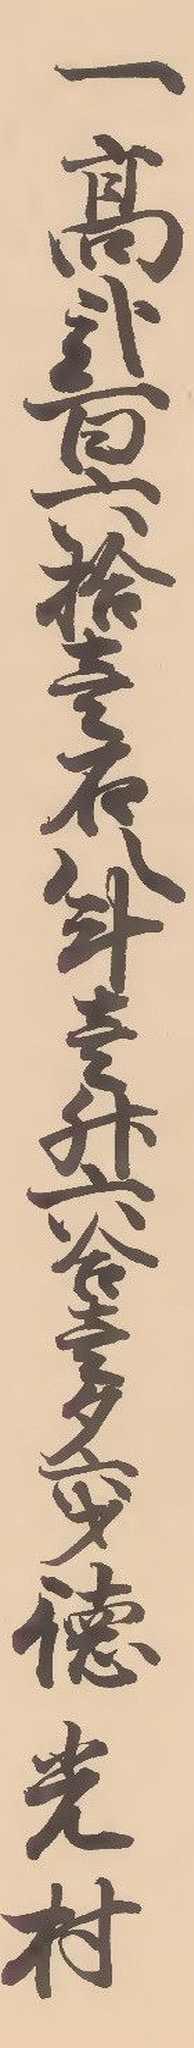一高弐百六拾壱石八斗壱升六合壱勺六才徳光村
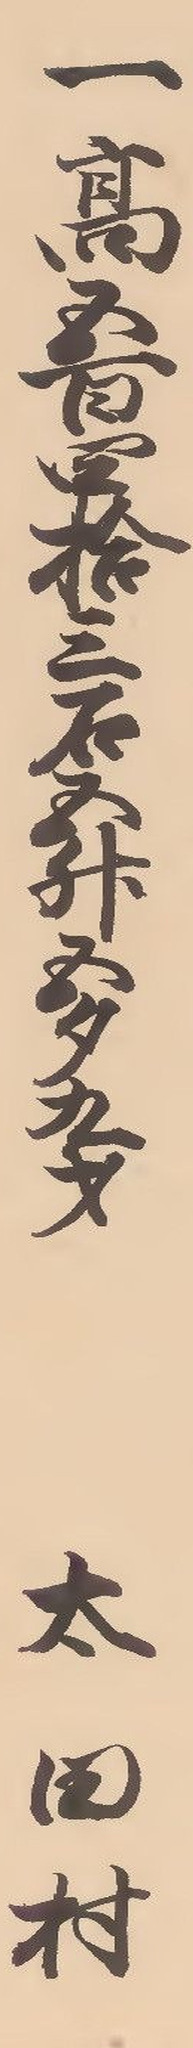一高五百四拾三石五升五勺九才太田村
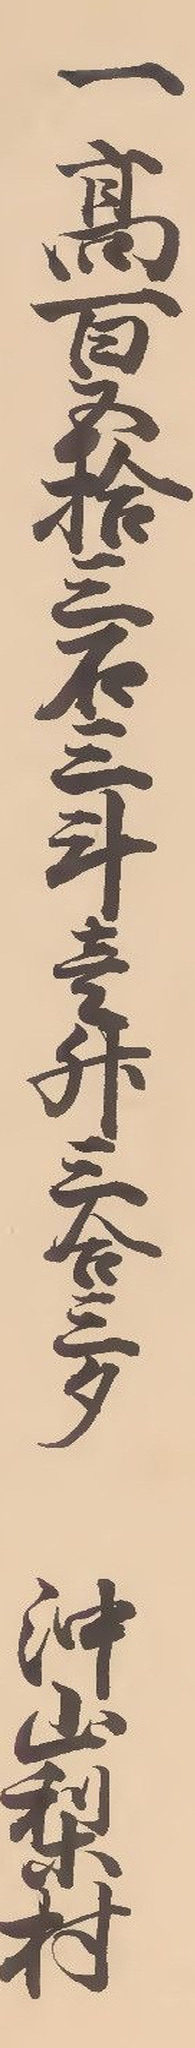一高百五拾三石三斗壱升三合三勺沖山梨村
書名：遠江国郷帳
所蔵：国立公文書館 National Archives of Japan
